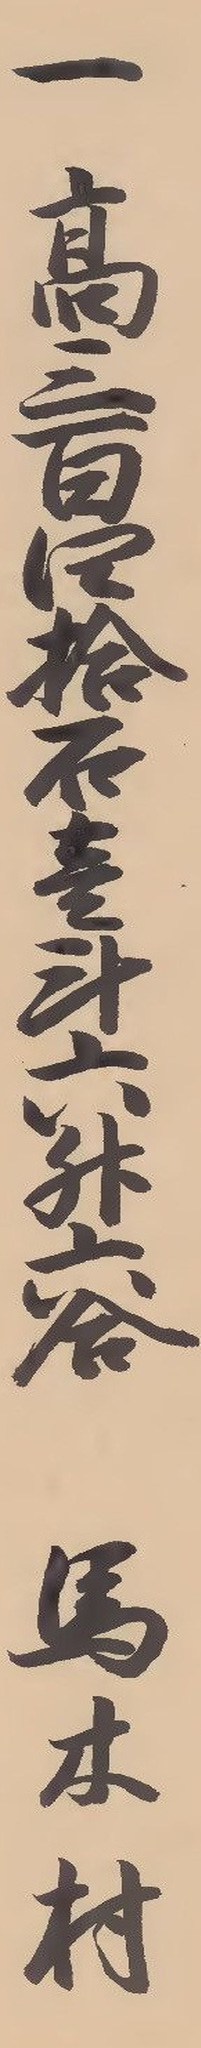一高三百四拾石壱斗六升六合馬木村
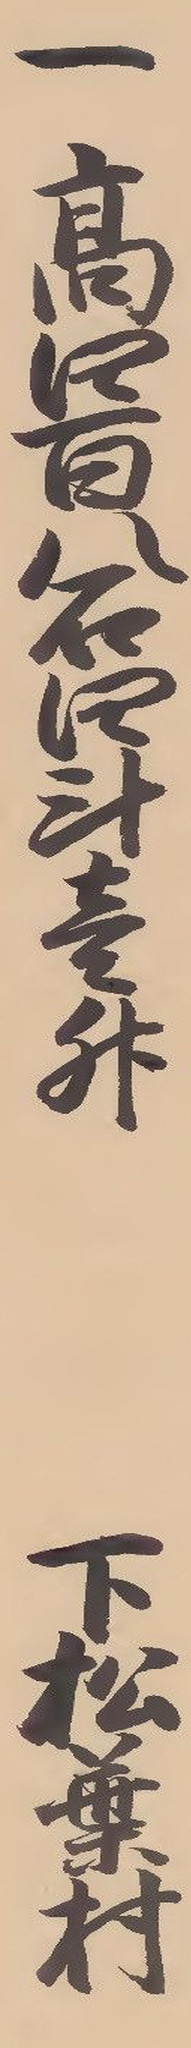一高四百八石四斗壱升下松葉村

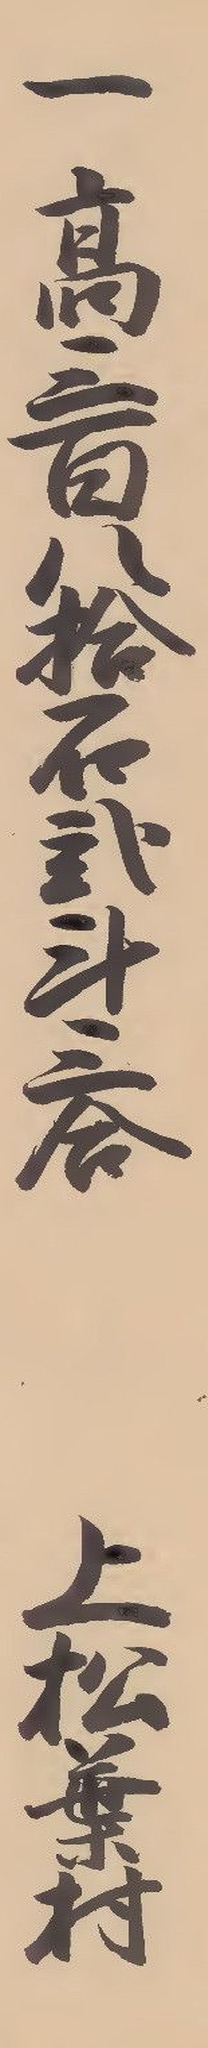一高三百八拾石弐斗三合上松葉村
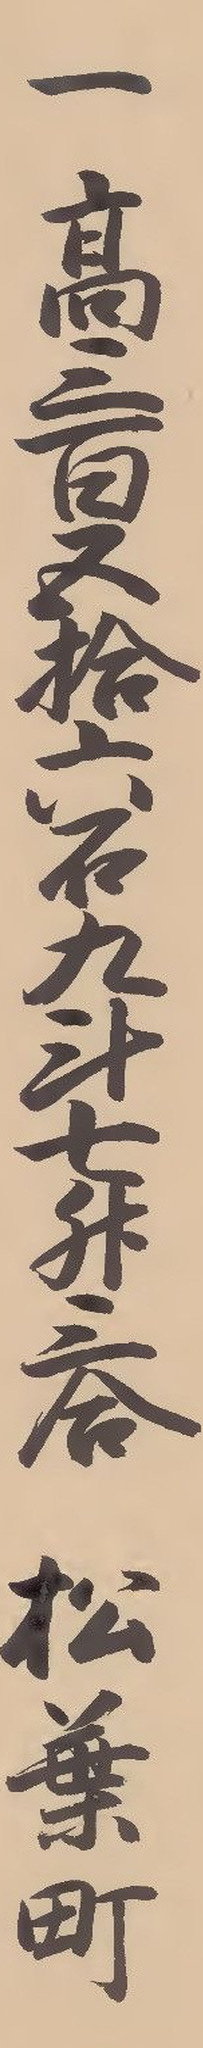一高三百五拾六石九斗七升三合松葉町
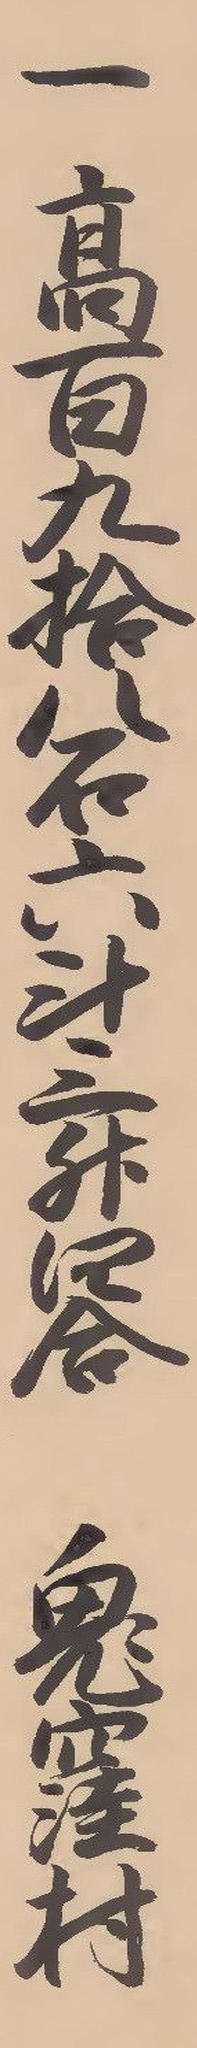一高百九拾八石六斗三升四合鬼窪村
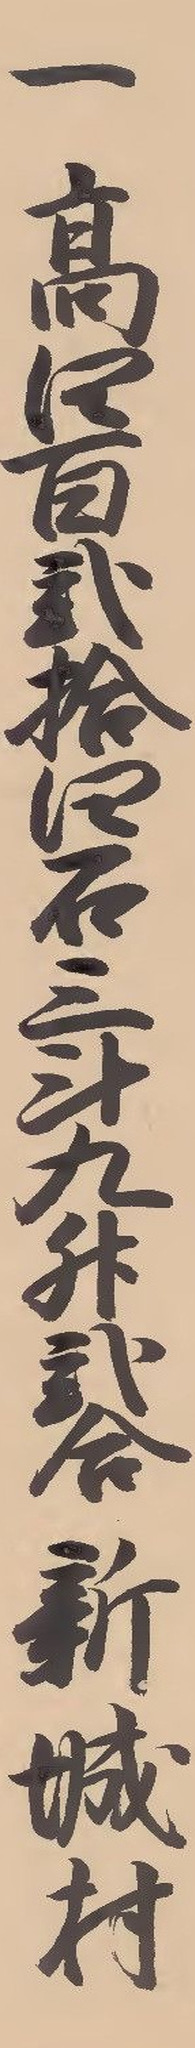一高四百弐拾四石三斗九升弐合新城村
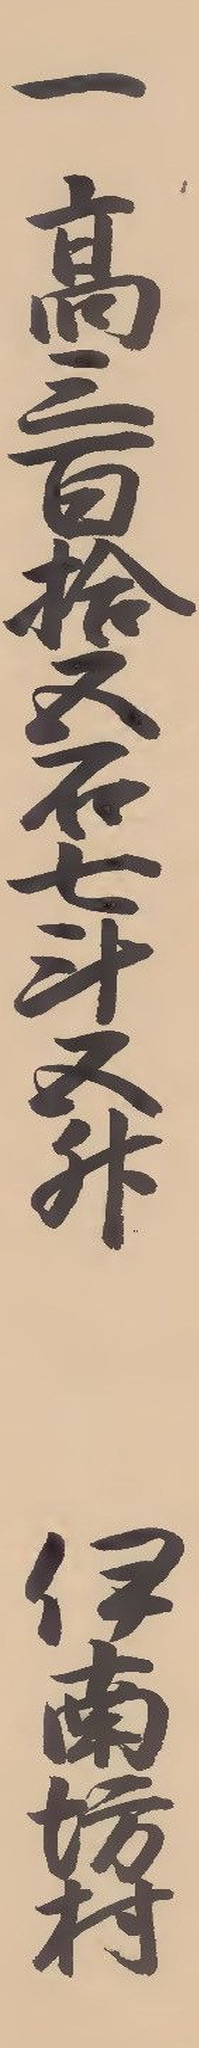一高三百拾五石七斗五升伊南坊村
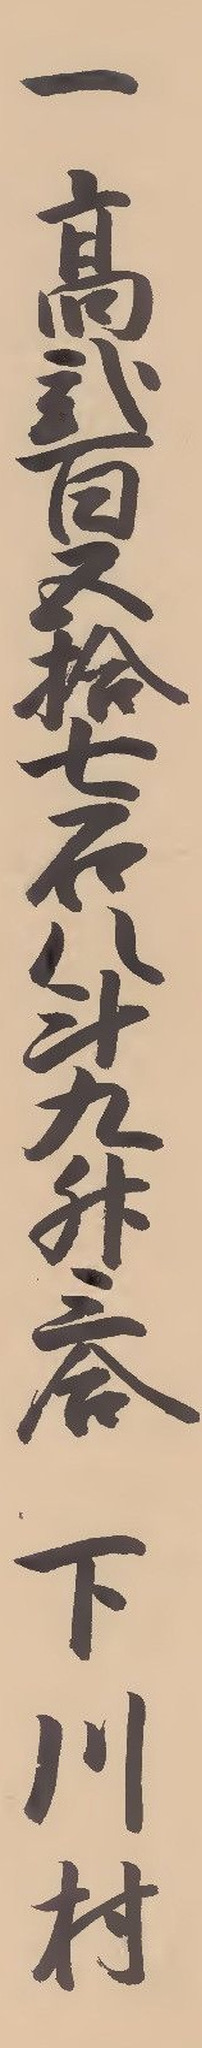一高弐百五拾七石八斗九升三合下川村
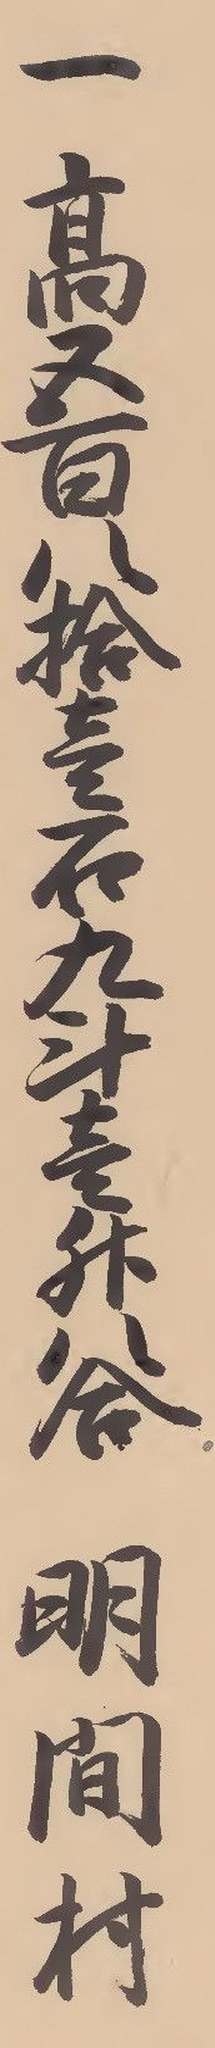一高五百八拾壱石九斗壱升八合明間村

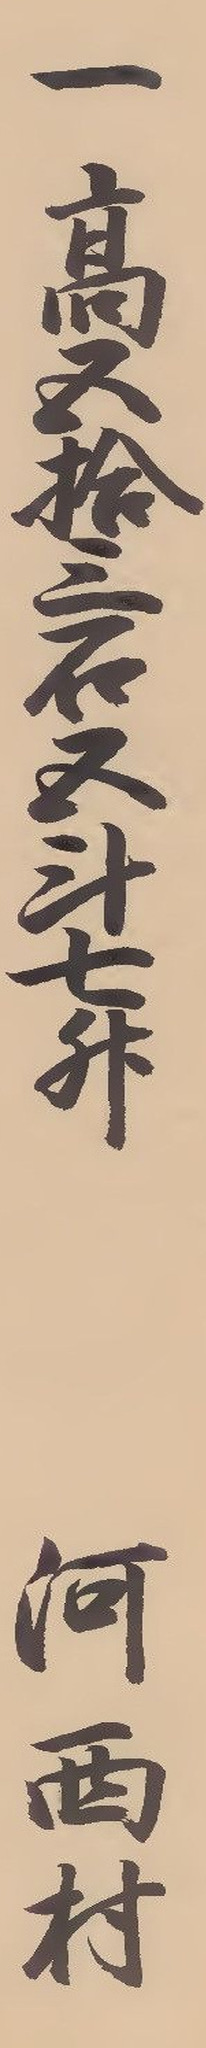一高五拾三石五斗七升河西村
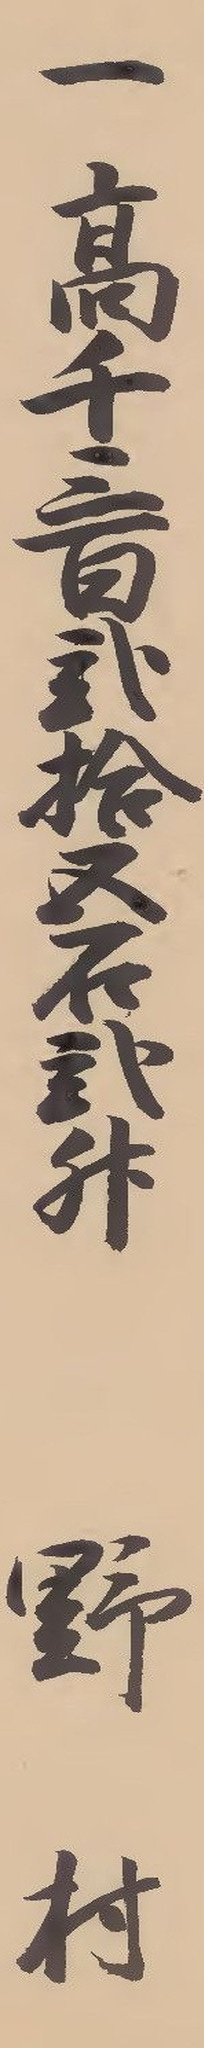一高千三百弐拾五石弐升野村
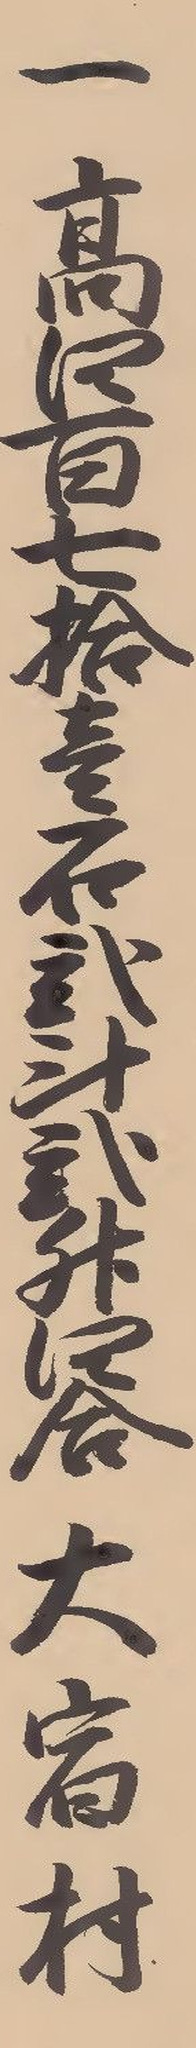一高四百七拾壱石弐斗弐升四合大宿村
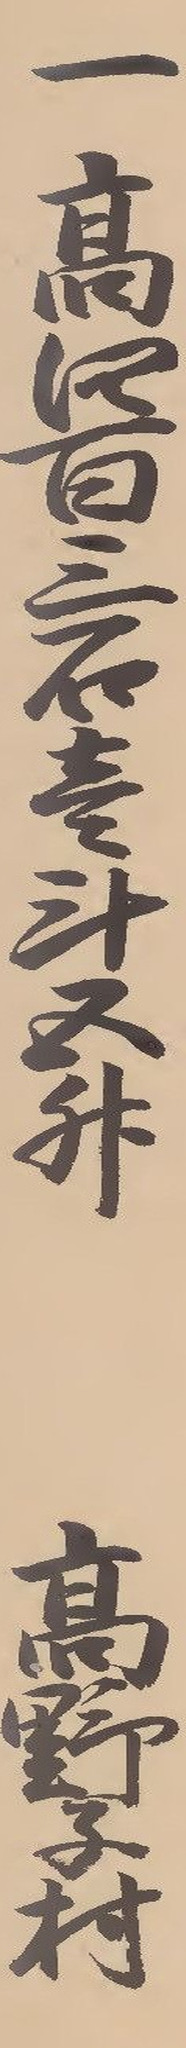一高四百三石壱斗五升高野子村
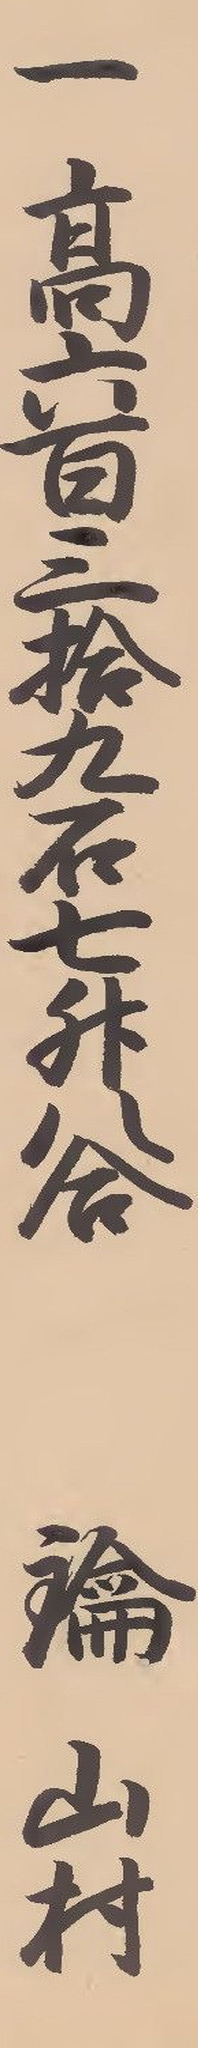一高六百三拾九石七升八合鑰山村
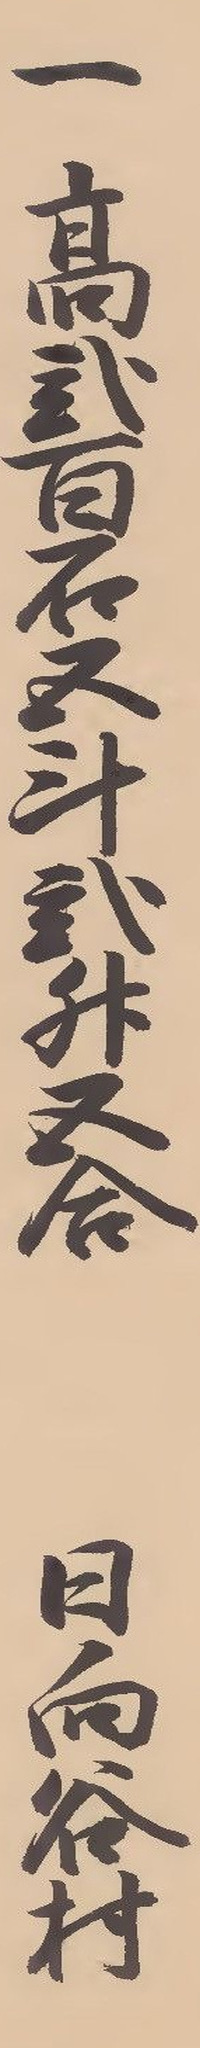一高弐百石五斗弐升五合日向谷村
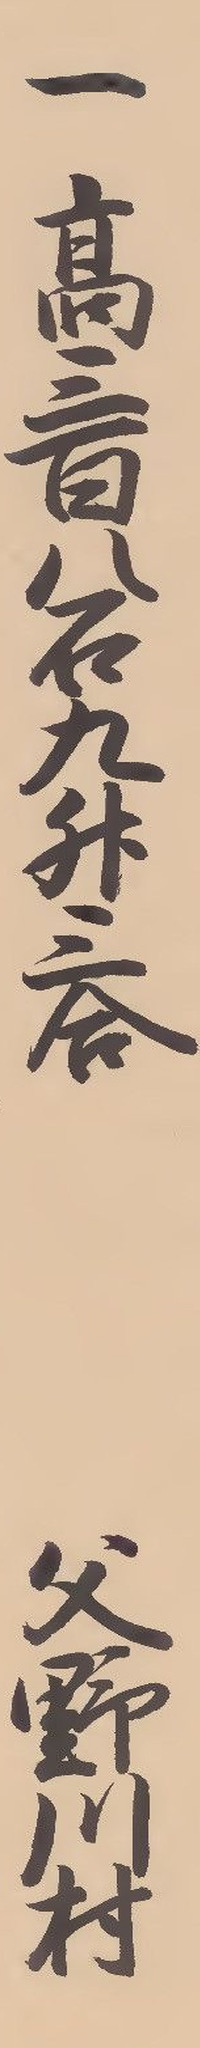一高三百八石九升三合父野川村
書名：伊予国郷帳
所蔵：国立公文書館 National Archives of Japan
